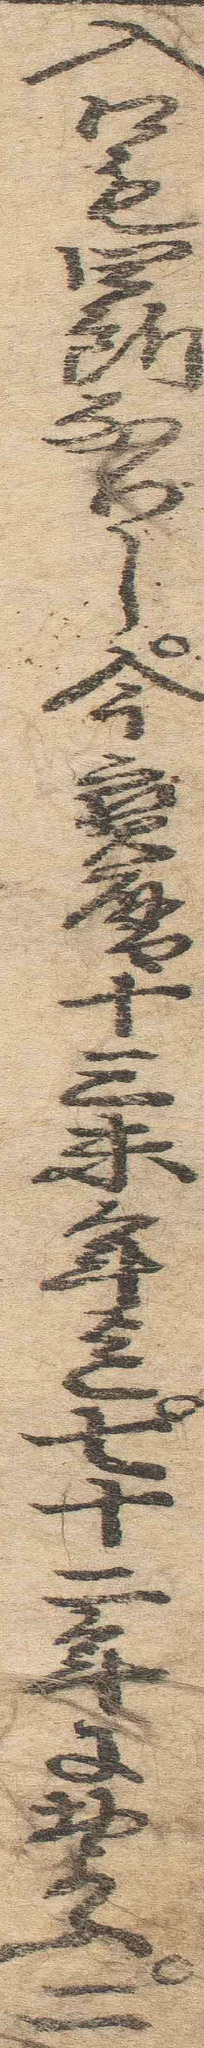入口も四所なりし。今宝暦十三未年迄。七十二年におよふ。二
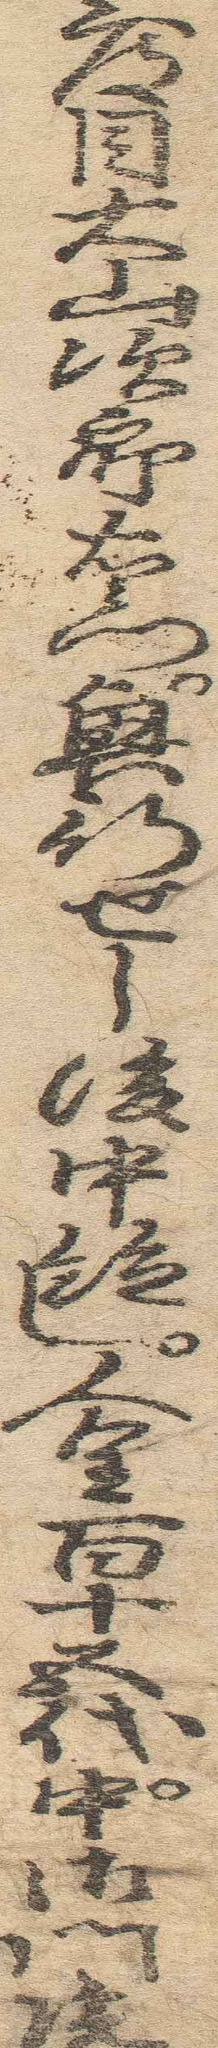度目大山次郎右衛門。興行せし後中絶し。人皇百十五代。中御門院
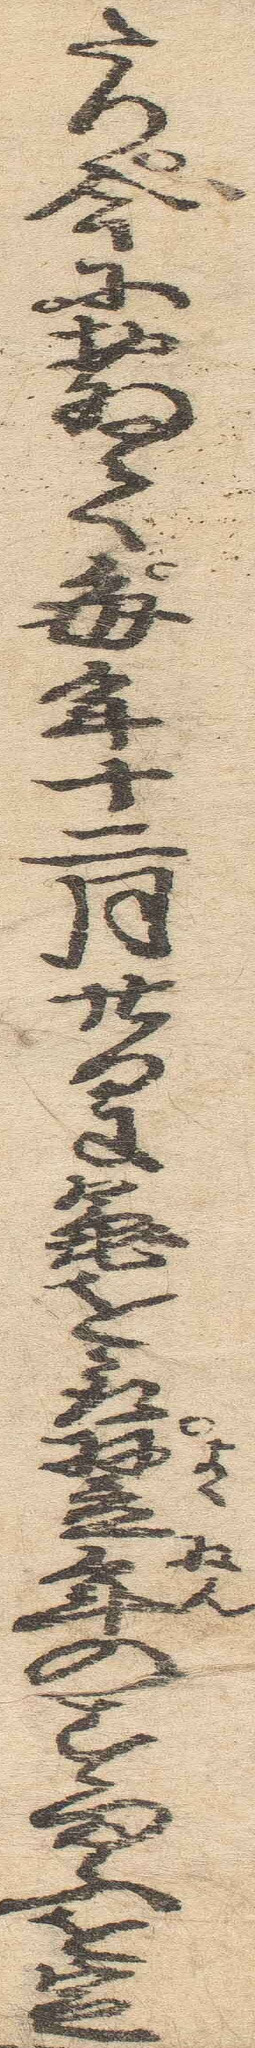たり。今におゐて。毎年十二月廿日に鬮を取。翌年のすまふを定
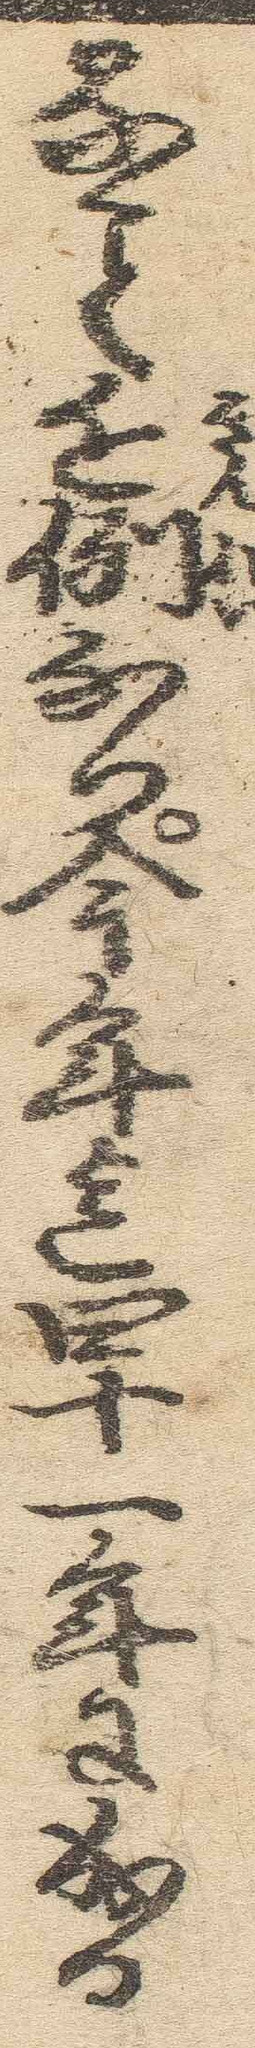ること近例なり。今年迄四十一年に成る
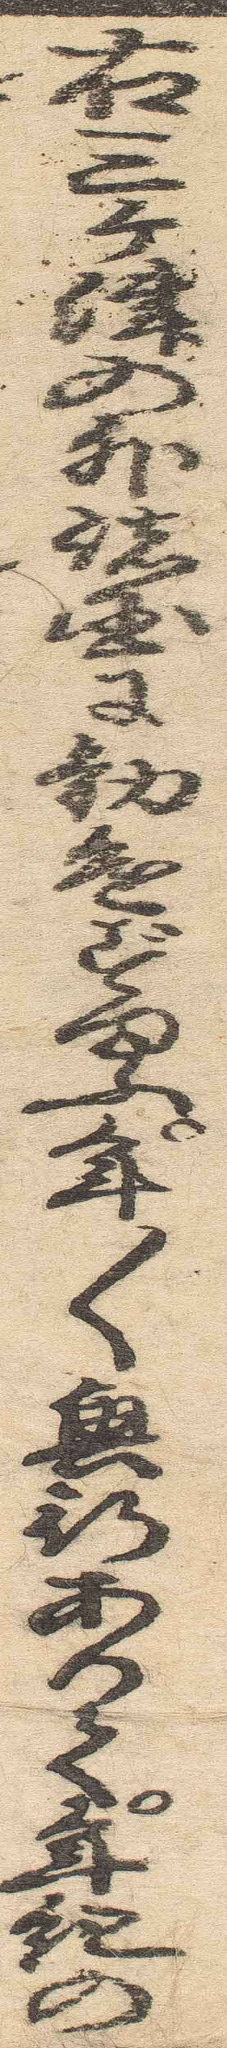右三ヶ條の外諸国に勧進ずまふ。年〳〵興行ありて。年紀の
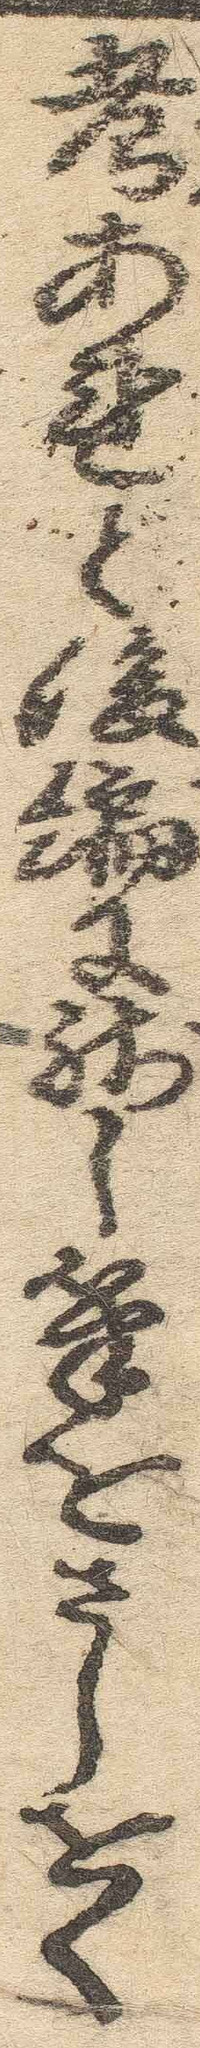考あれど後編に残し筆をさしをく
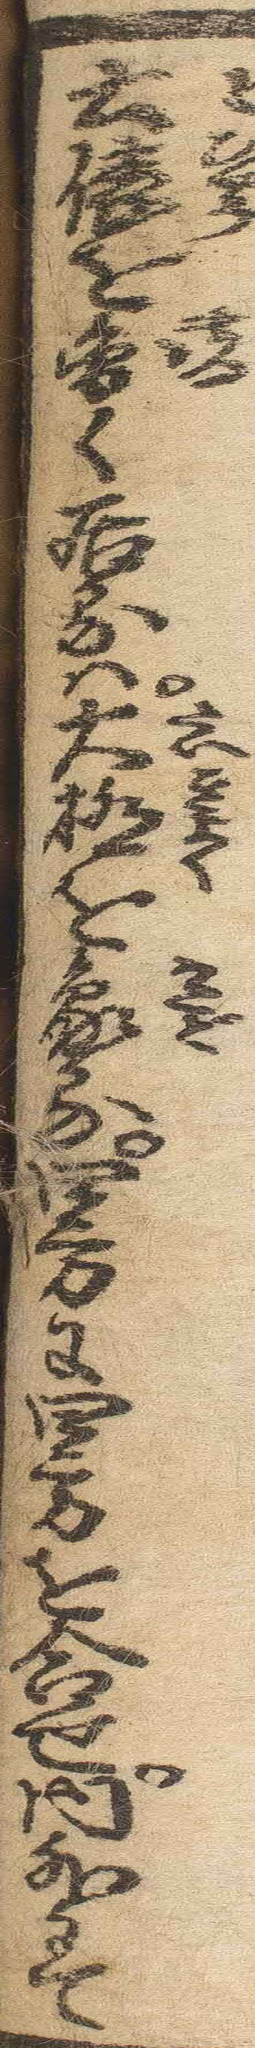土俵を圓く居るは。大極を象る。四方に四方を合せ。内外にて
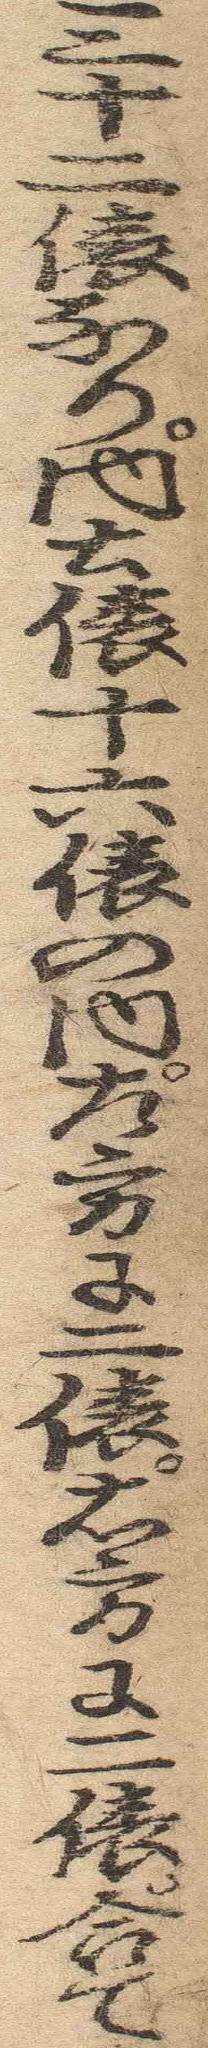三十二俵なり。内土俵十六俵の内。左方に二俵。右方に二俵。合て
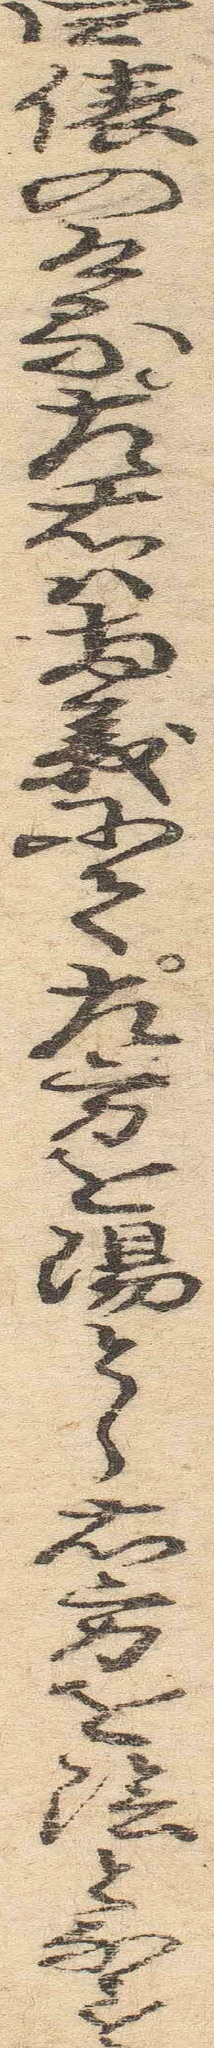四俵のける。左右は両義にて。左方を湯とし右方を法となす。
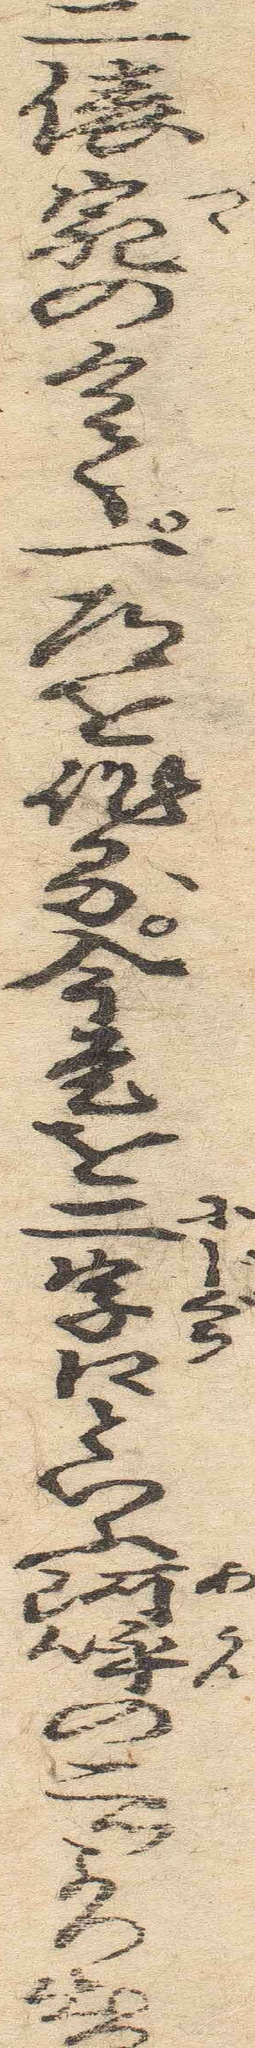二俵宛のけて。一道を作る。今是を二字口といふ阿吽の二ツより出る
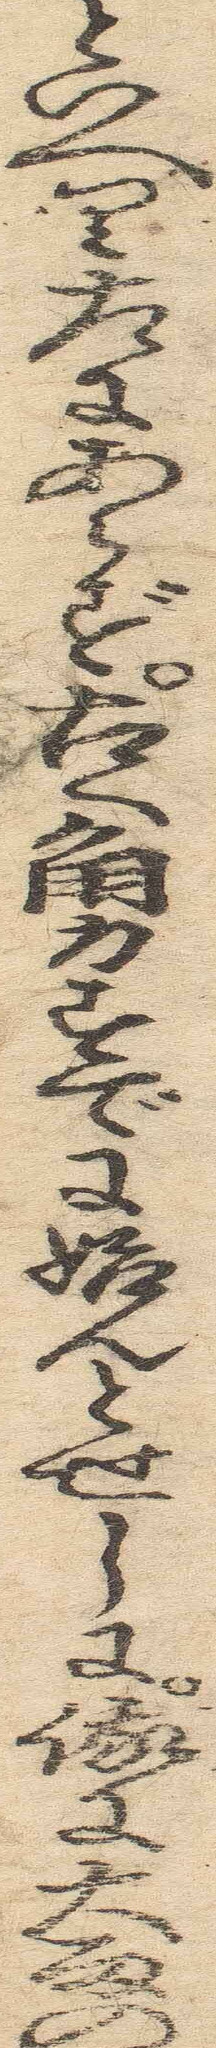といへり左にあらず。古へ角力すでに始んとせしに。俄に大雨の
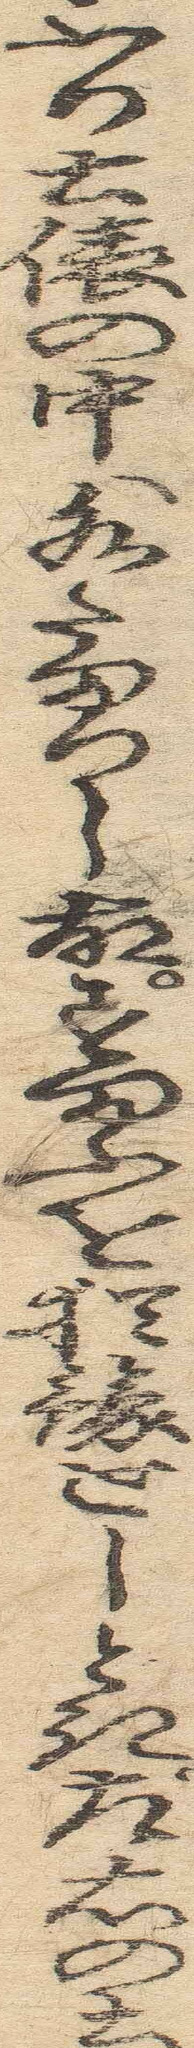ふり土俵の中へ水たまりし故。すまふを猶予せしとき。左右の土
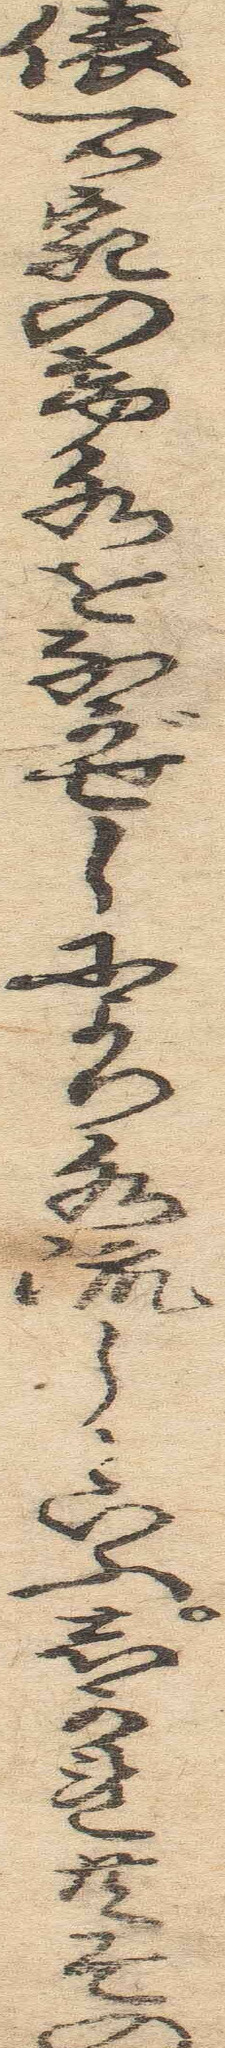俵一ツ宛のけ水をながせしにより水流しといふ。しかれ共その
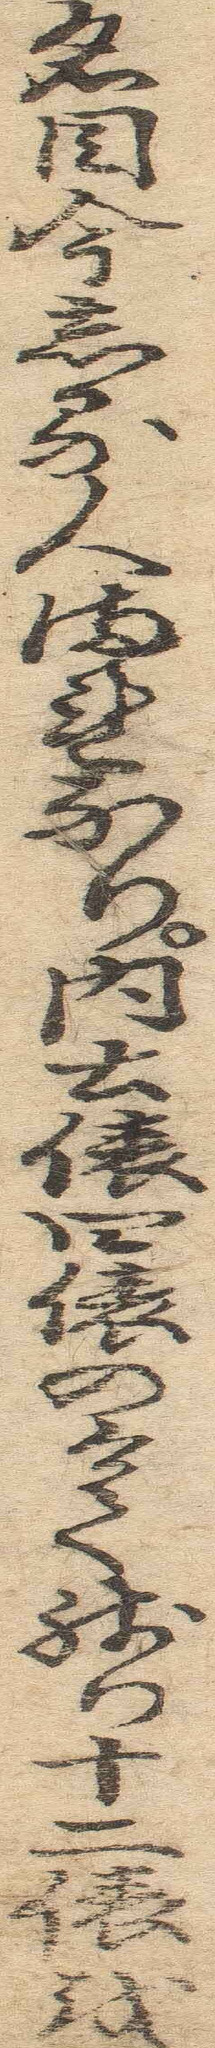名目今しる人まれなり。内土俵四俵のけて残り十二俵を
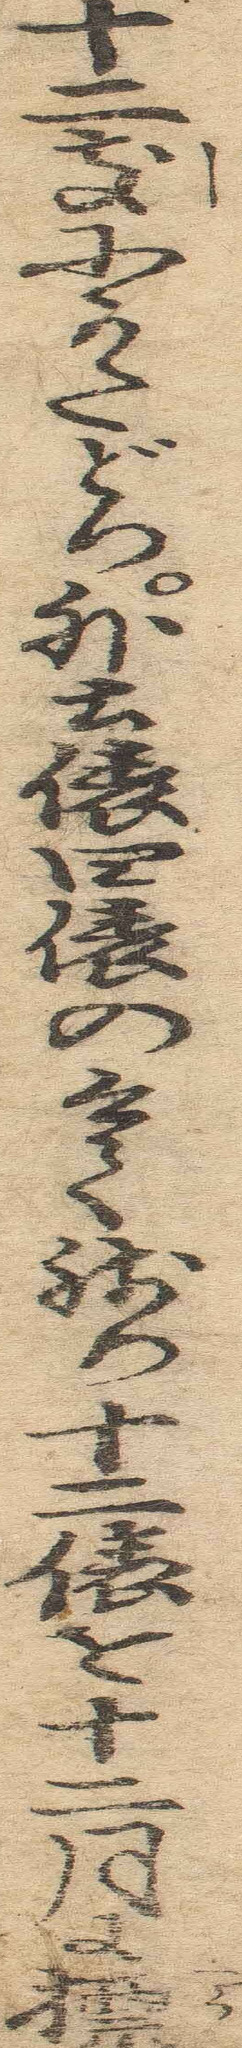十二支にかどたり。外土俵四俵のけて残り十二俵を十二月に標
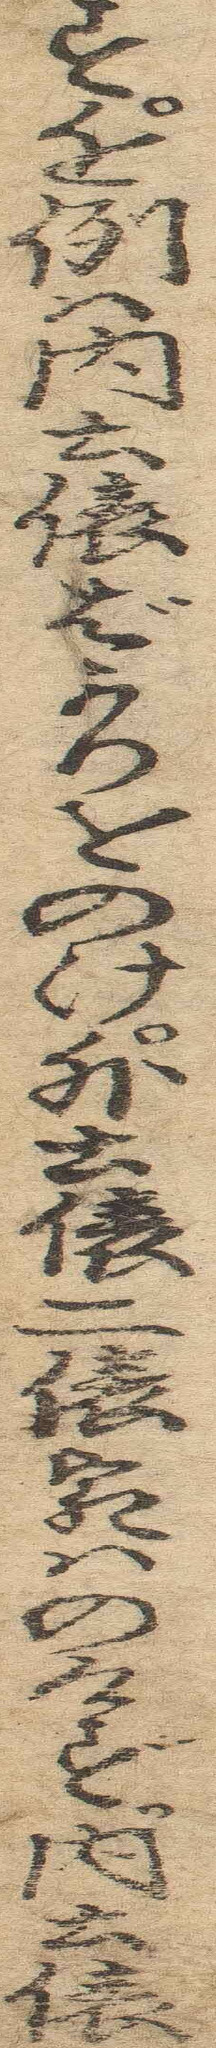す。近例は内土俵ばかりをのけ。外土俵二俵宛はのけず。内土俵
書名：古今相撲大全
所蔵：東京学芸大学附属図書館 国文学研究資料館
